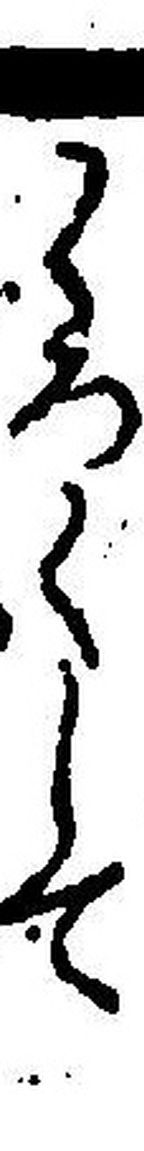くろくして
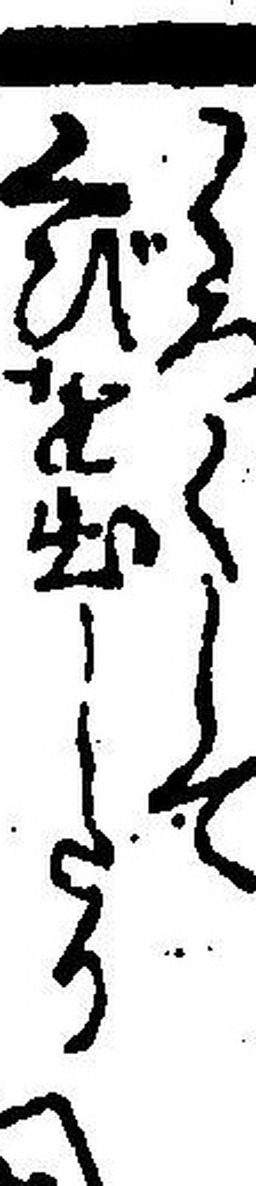くびを出したり
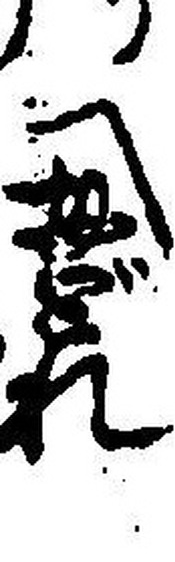〽おどれ
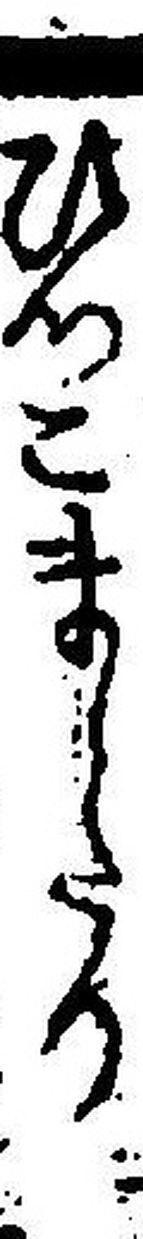ひつこましたり
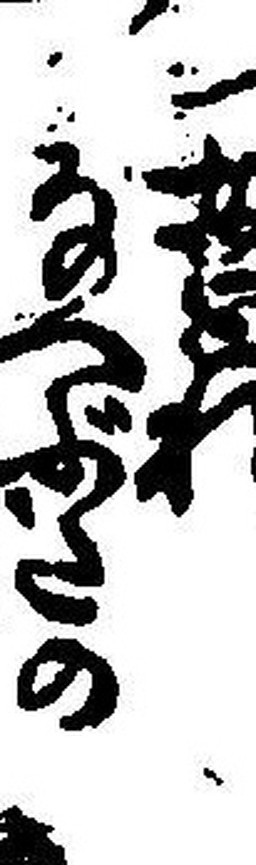なへぶたの
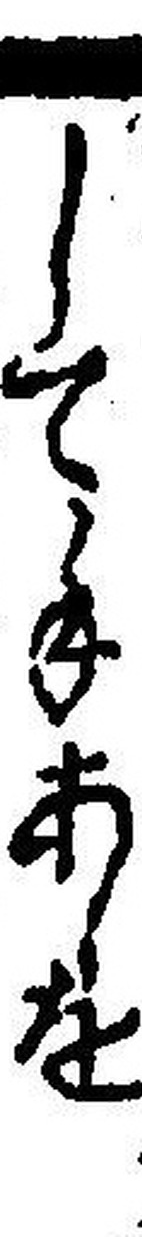して手あしを
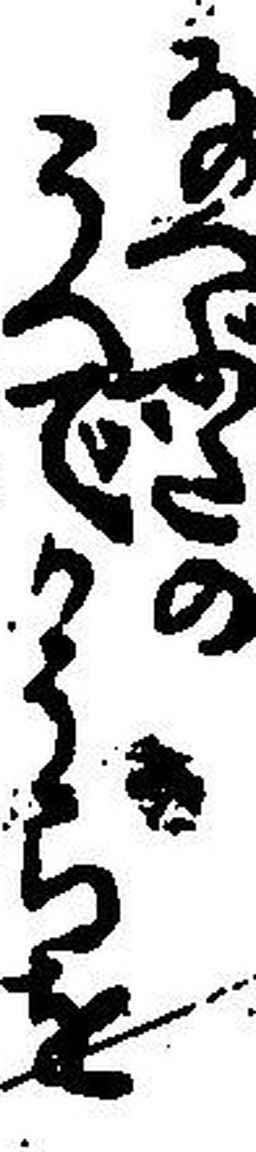うへでかうらを
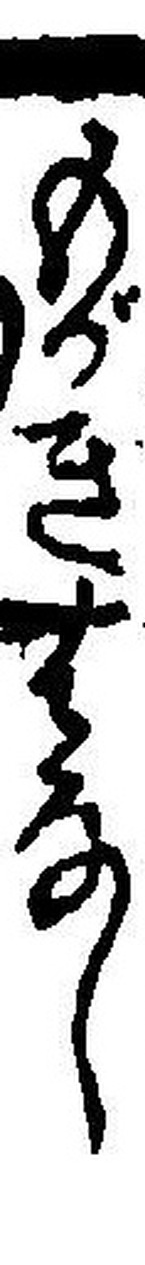もがきはなし
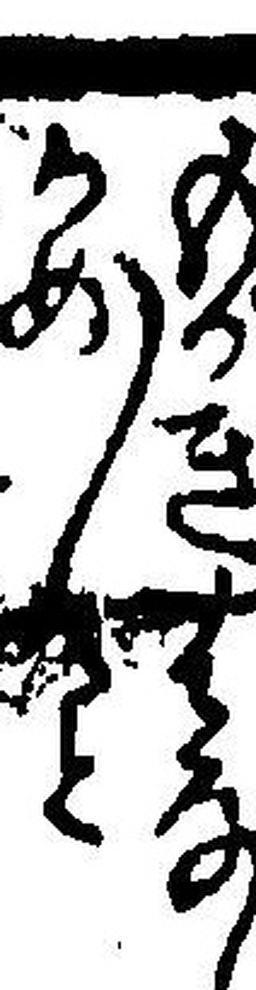かめ〳〵と
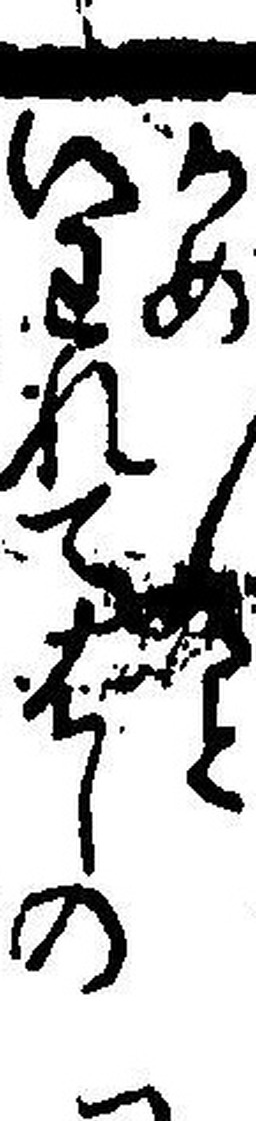いわれてはしの
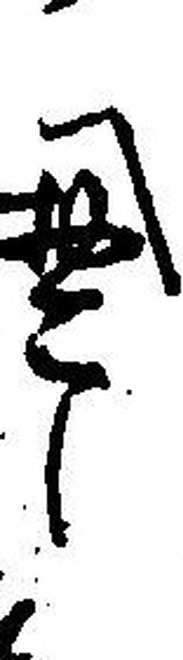〽おこし
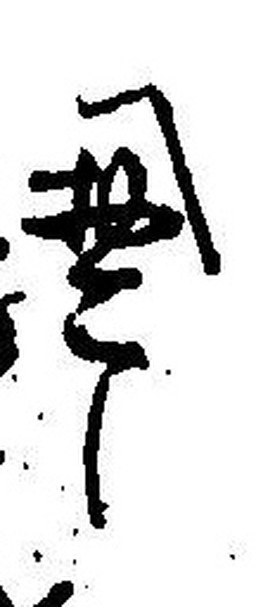〽おこし
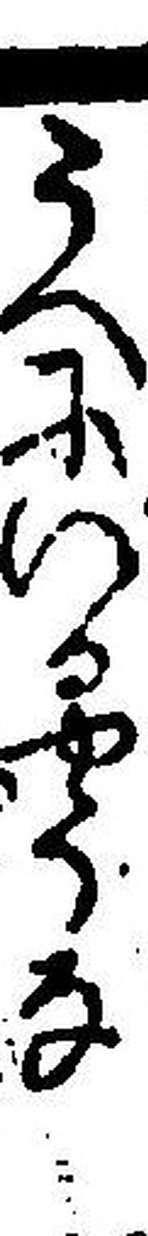うへにいるやうな
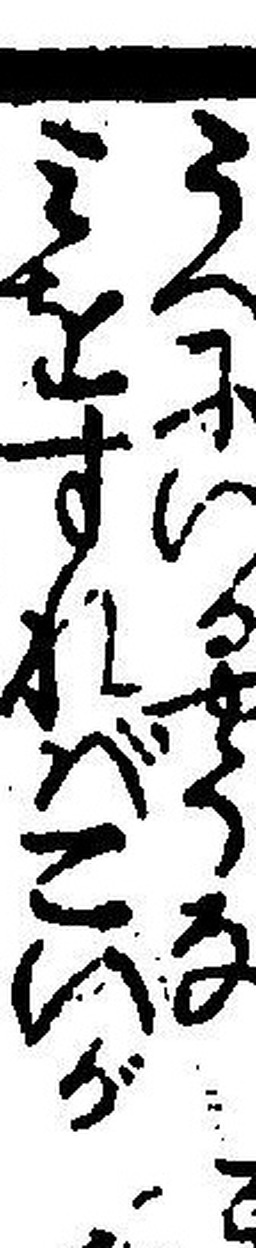みをすればこいが
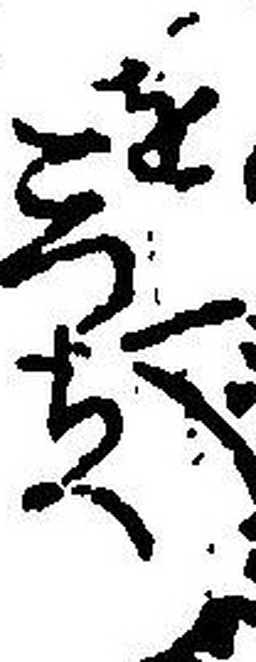こつちへ
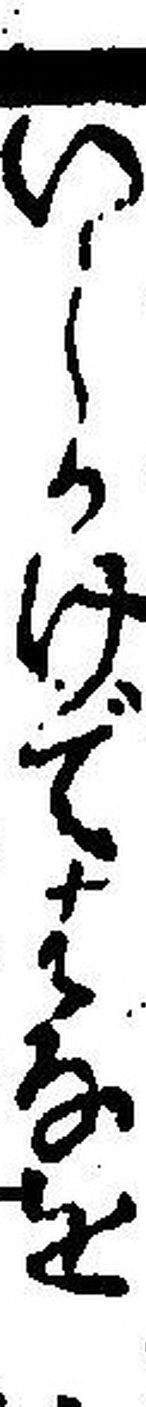いしかげてはなを
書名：徳若水縁起金性 / 樹下石上作
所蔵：東京大学総合図書館 General Library in the University of Tokyo, JAPAN
